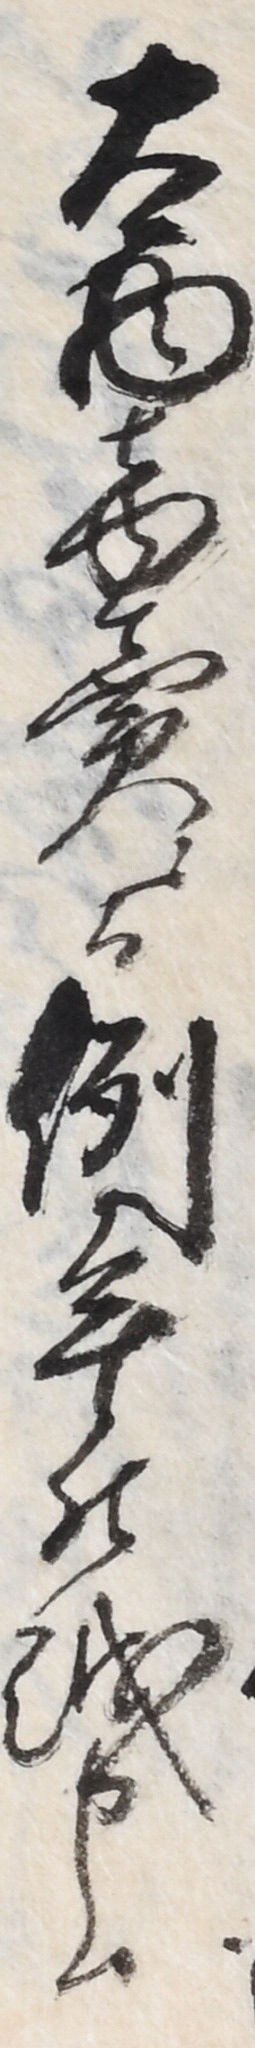薬商売ニ而例年罷越申候
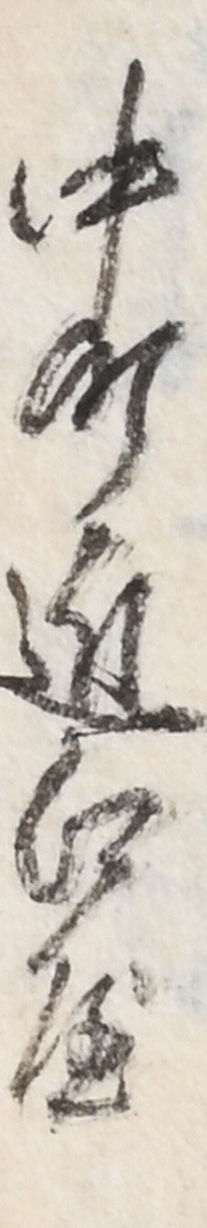中町近江屋
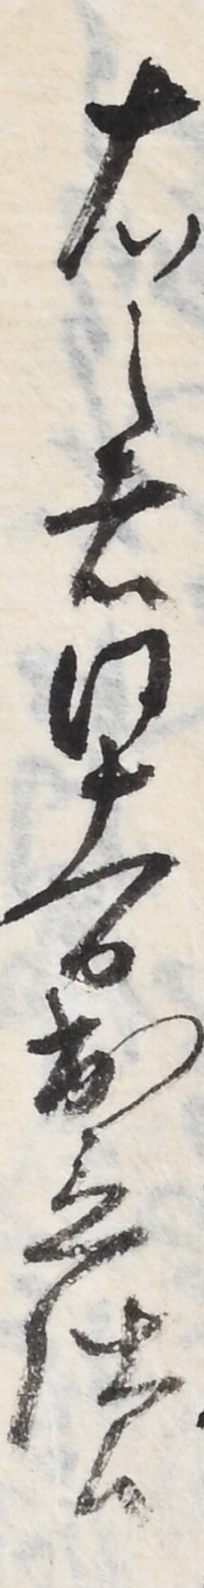右之者同十八日出立仕候
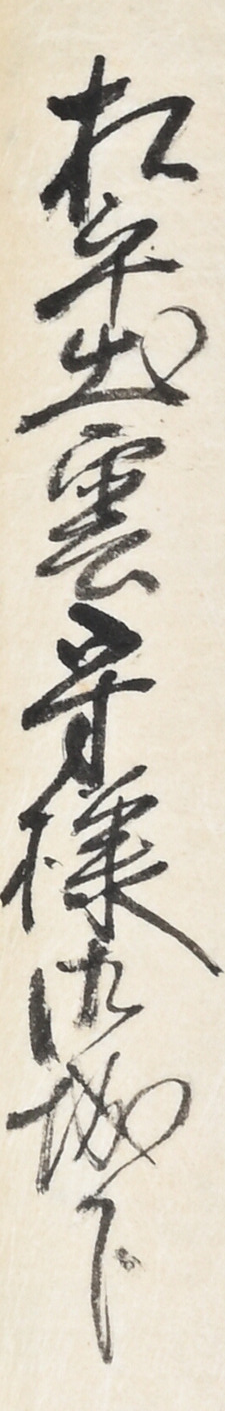遠山出羽守様御城下
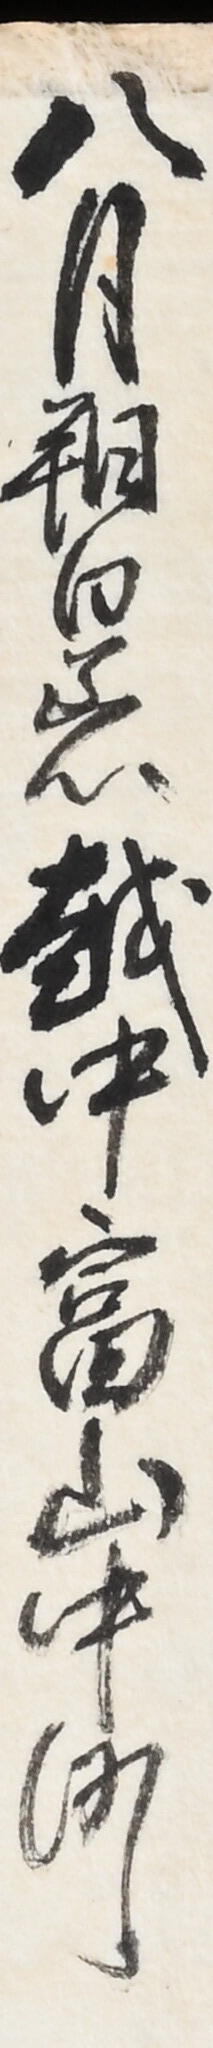八月朔日着越中富山中町
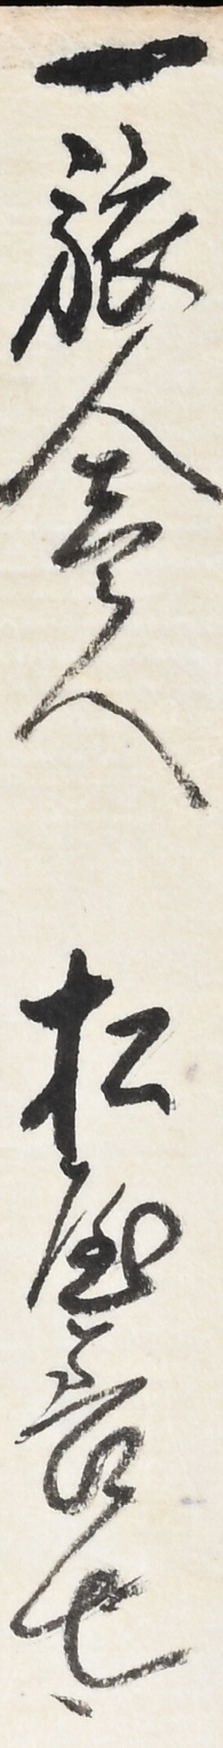一旅人壱人松屋善七・
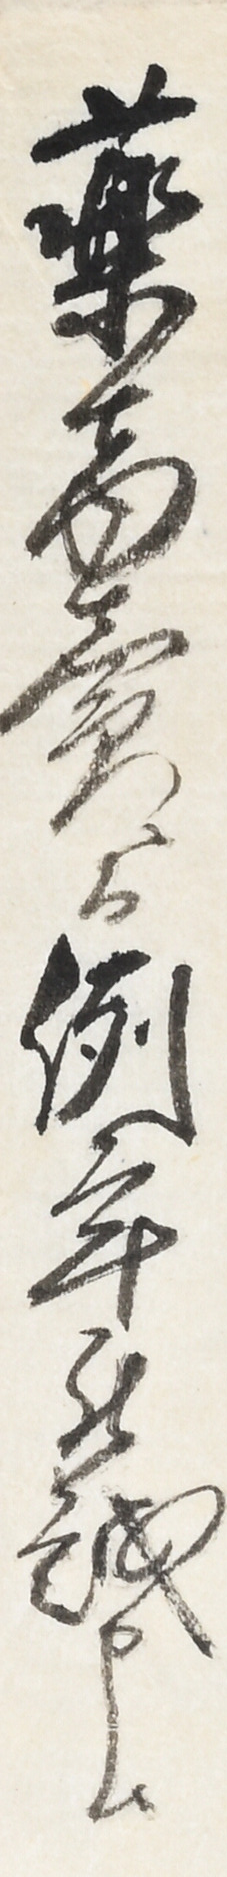薬商売ニ而例年罷越申候
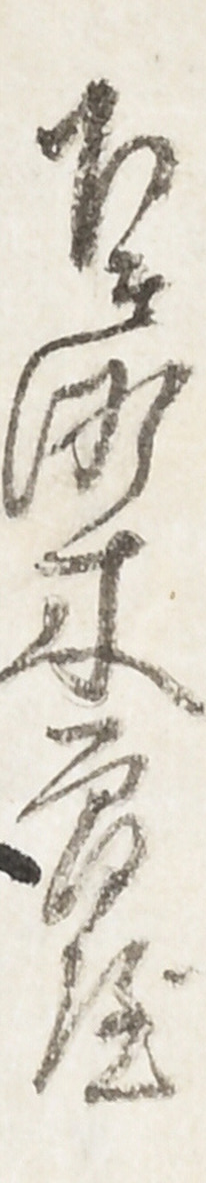下モ町木曽屋
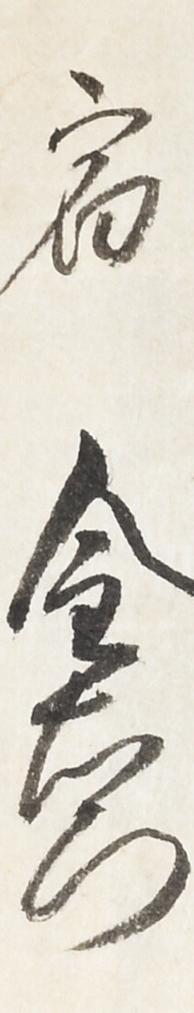宿金右衛門
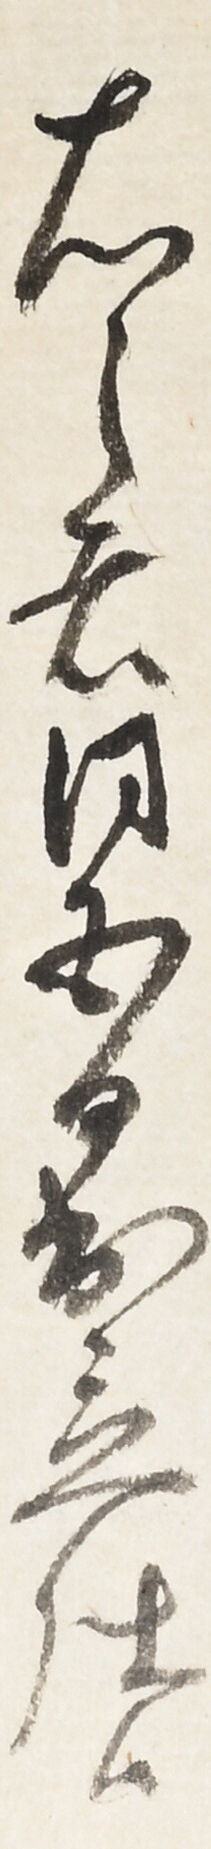右之者同五日出立仕候
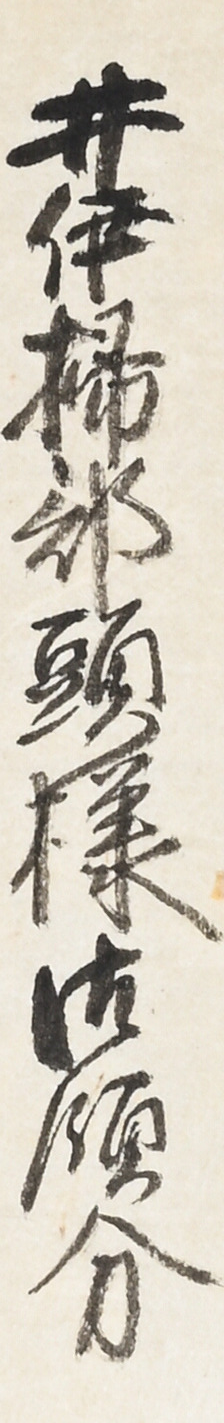井伊掃部頭様御領分
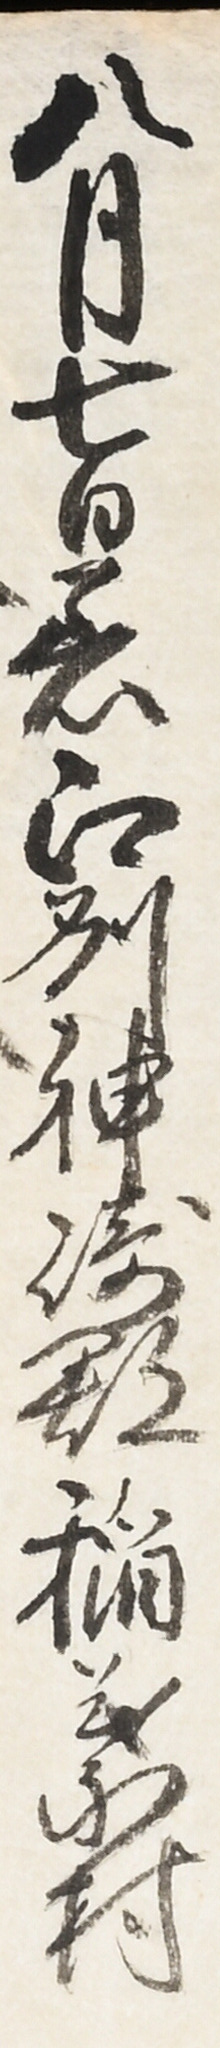八月七日着江州神崎郡稲葉村
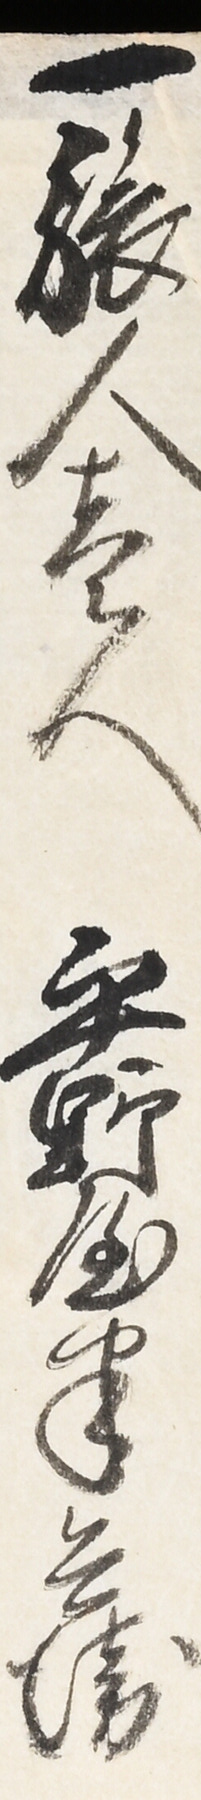一旅人壱人平野屋半兵衛
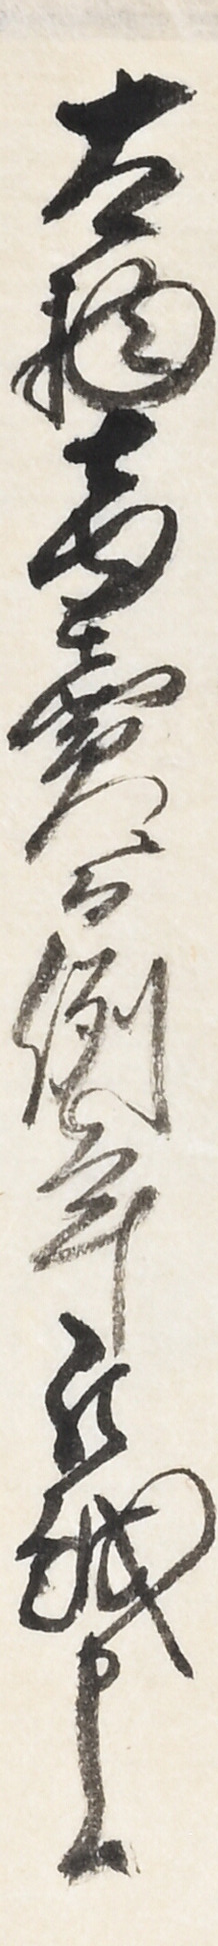太物商売ニ而例年罷越申候
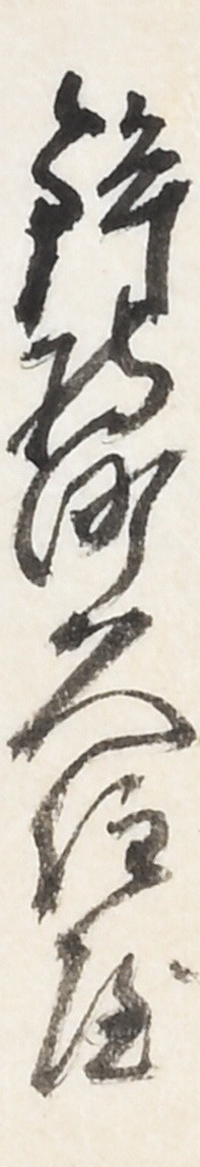鉾持町久住屋
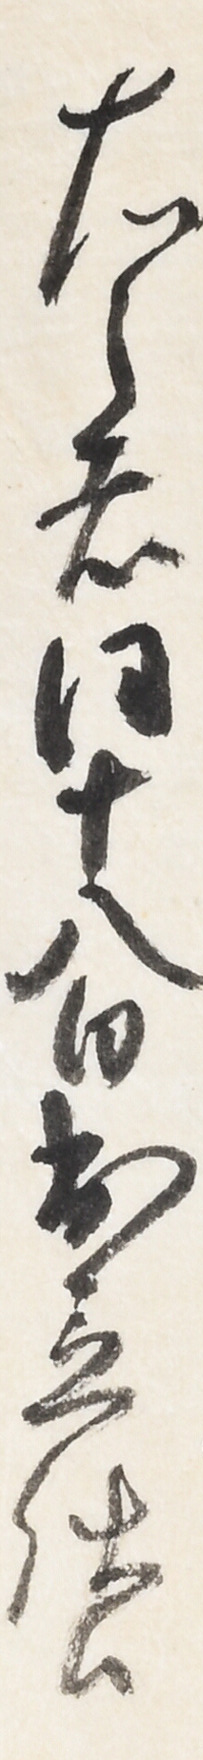右之者同十八日出立仕候
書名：旅人泊控帳
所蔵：伊那市立高遠町図書館・合同会社AMANE
